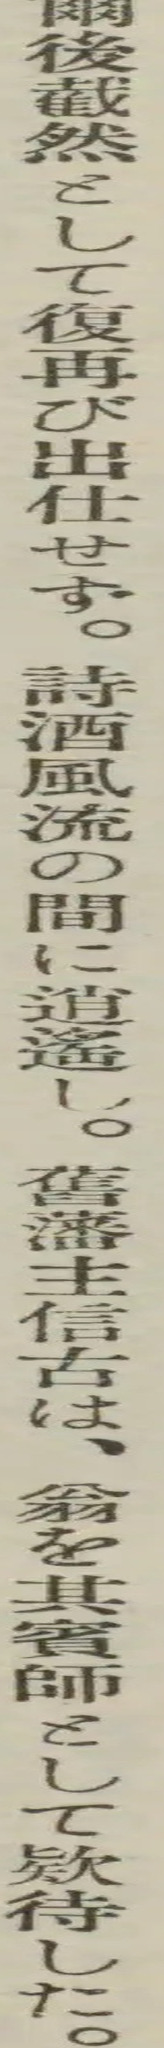爾後截然として復再び出仕せず。詩酒風流の間に逍遥し。旧藩主信古は、翁を其賓師として欵待した。
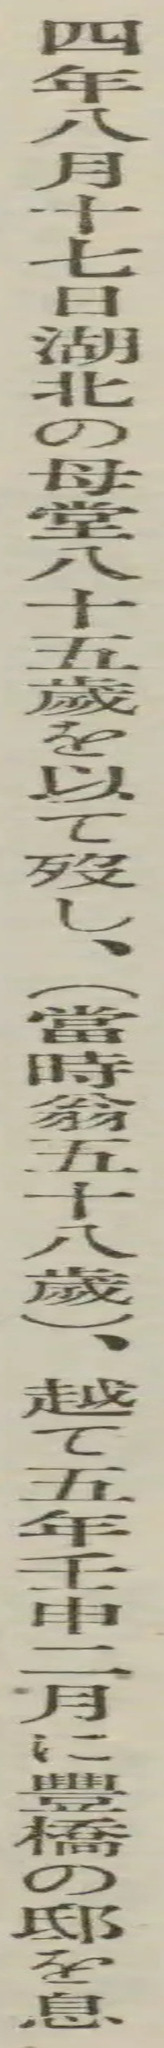四年八月十七日湖北の母堂八十五歳を以て歿し、(当時翁五十八歳)、越て五年壬申二月に豊橋の邸を息
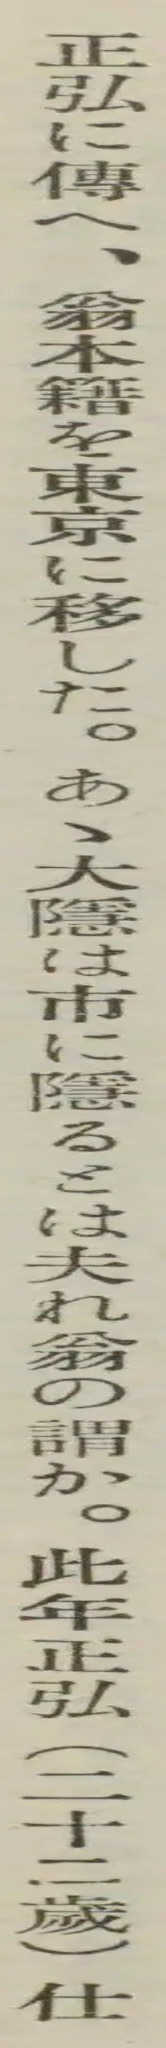正弘に伝へ、翁本籍を東京に移した。あゝ大隠は市に隠るとは夫れ翁の謂か。此年正弘(二十二歳)仕
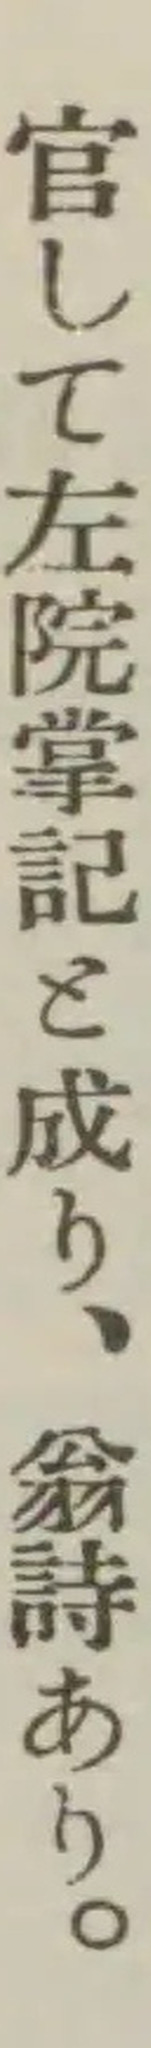官して左印掌記と成り、翁詩あり。
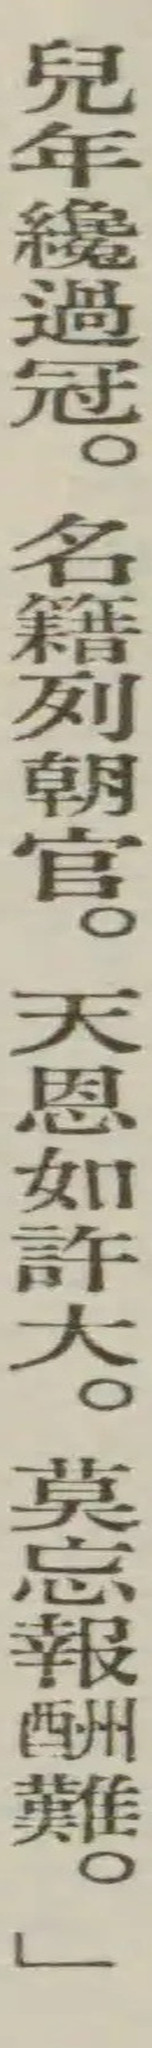兒年纔過冠。名籍列朝官。天恩如許大。莫忘報酬難。」
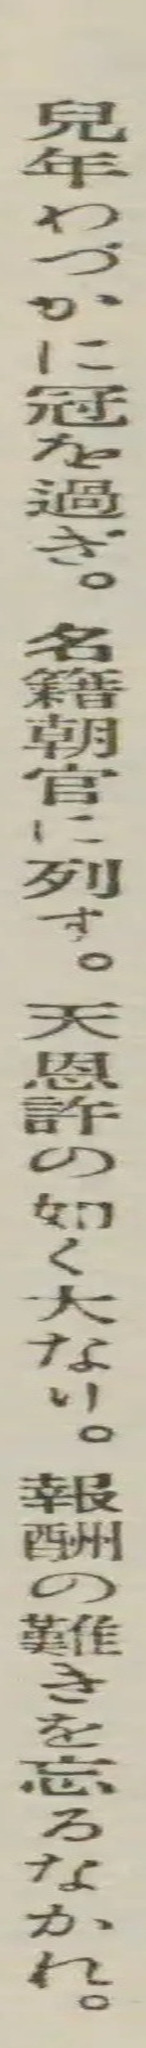兒年わづかに冠を過ぎ。名籍朝官に列す。天恩許の如く大なり。報酬の難きを忘るなかれ。
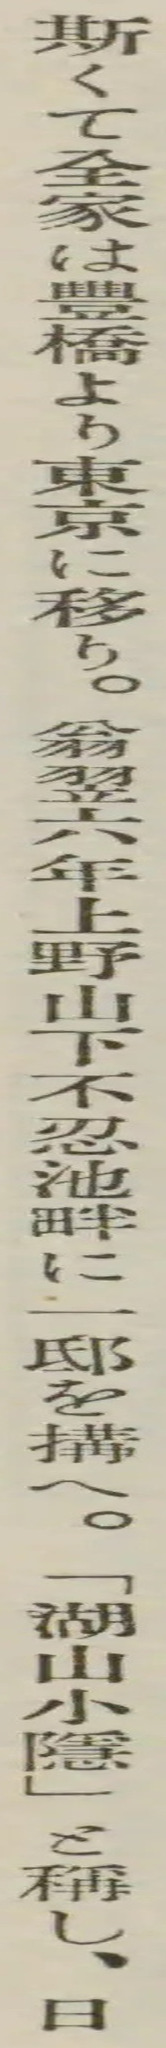斯くて全家は豊橋より東京に移り。翁翌六年上野山下不忍池畔に一邸を搆へ。「湖山小隠」と称し、日
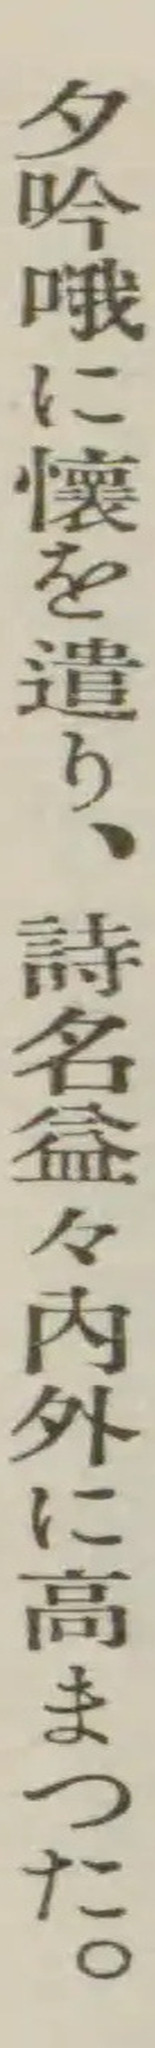夕吟哦に懐を遣り、詩名益々内外に高まつた。
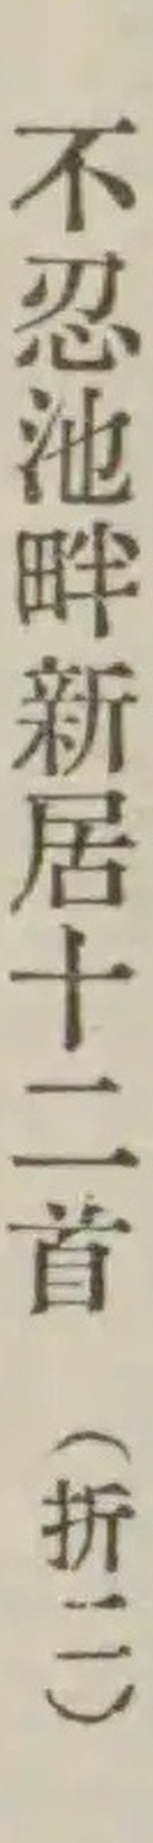不忍池畔新居十二首
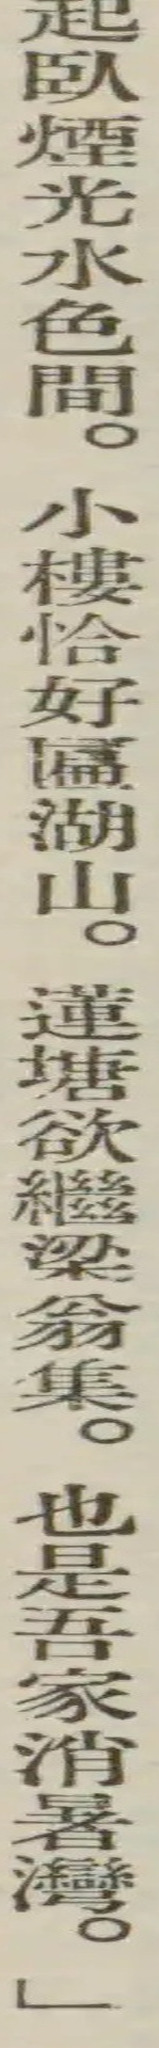起臥煙光水色間。小樓恰好匾湖山。蓮塘欲繼梁翁集。也是吾家消暑灣。」
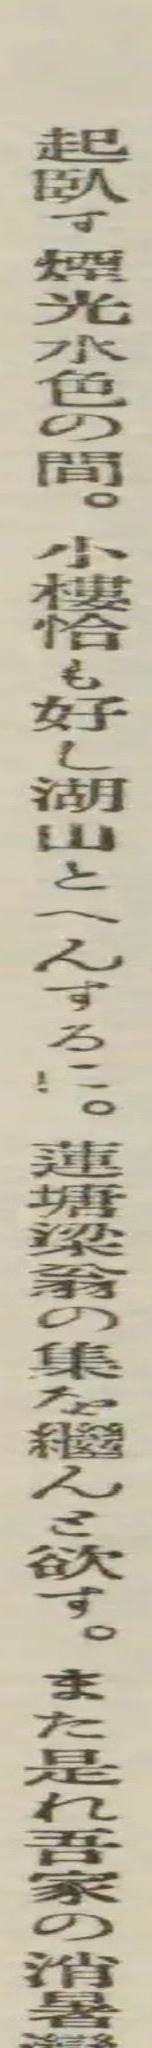起臥す煙光水色の間。小楼恰も好し湖山とへんするに。蓮塘梁翁の集を継んと欲す。また是れ吾家の消暑湾。
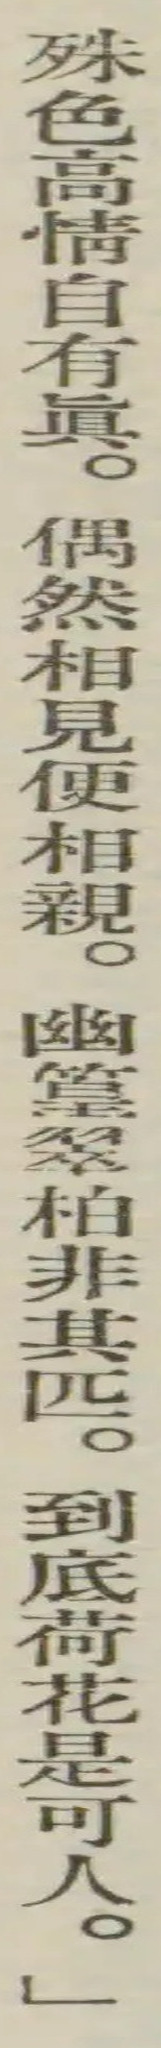殊色高情自有眞。偶然相見便相親。幽篁翠柏非其匹。到底荷花是可人。」
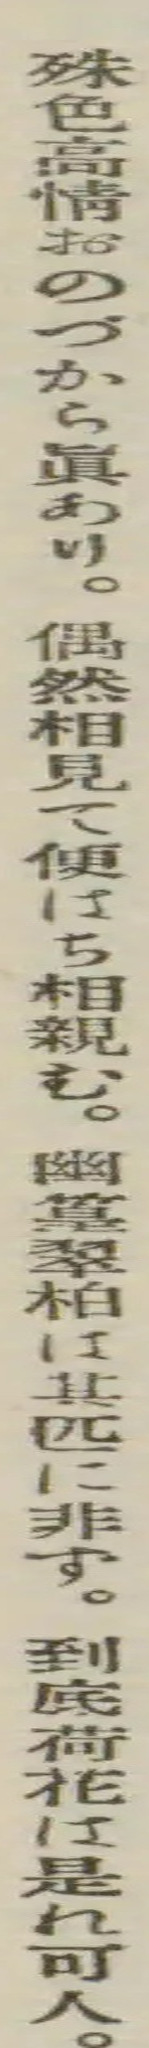殊色高情おのづから真あり。偶然相見て便はち相親む。幽篁翠柏は其匹に非ず。到底荷花は是れ可人。

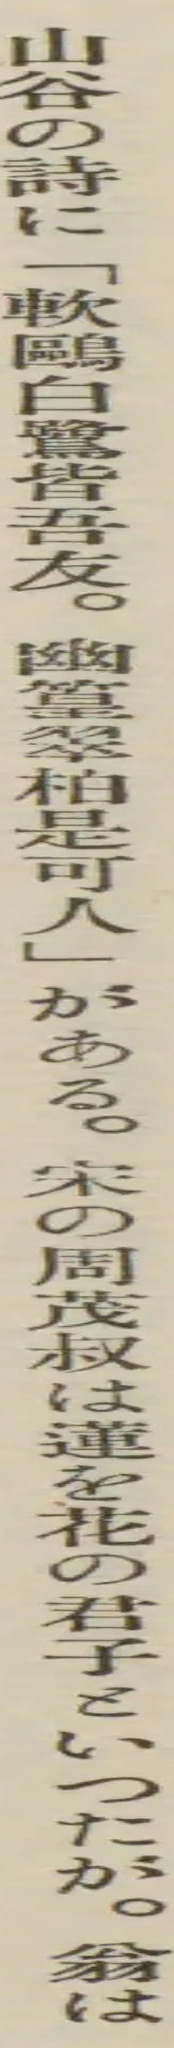山谷の詩に「軟鷗白鷺皆吾友。幽篁翠柏是可人」がある。宋の周茂叔は蓮を花の君子といつたが。翁は
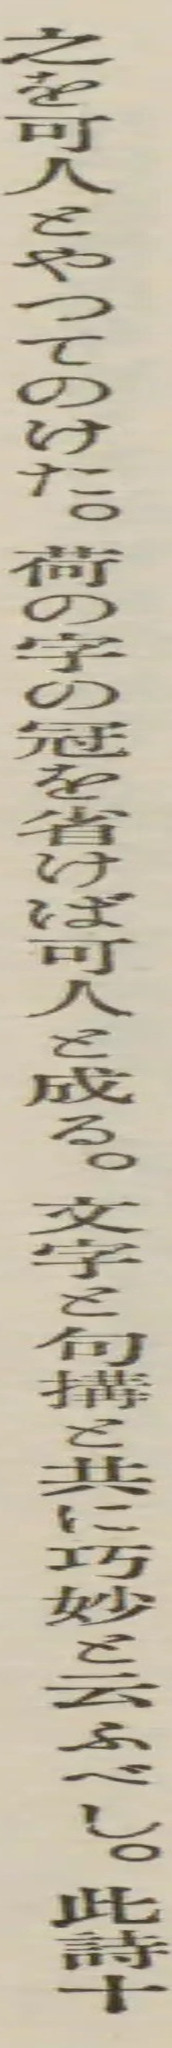之を可人とやつてのけた。荷の字の冠を省けば可人と成る。文字と句搆と共に巧妙と云ふべし。此詩十
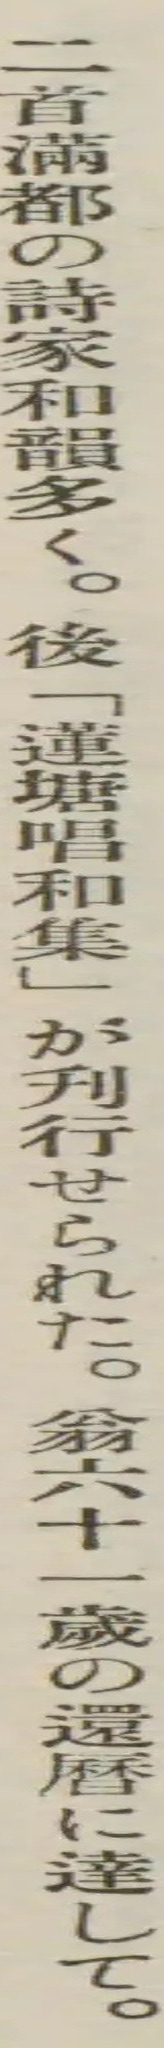二首満都の詩家和韻多く。後「蓮塘唱和集」が刊行せられた。翁六十一歳の還暦に達して。
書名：小野湖山翁小伝
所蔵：国立国会図書館 National Diet Library, JAPAN
